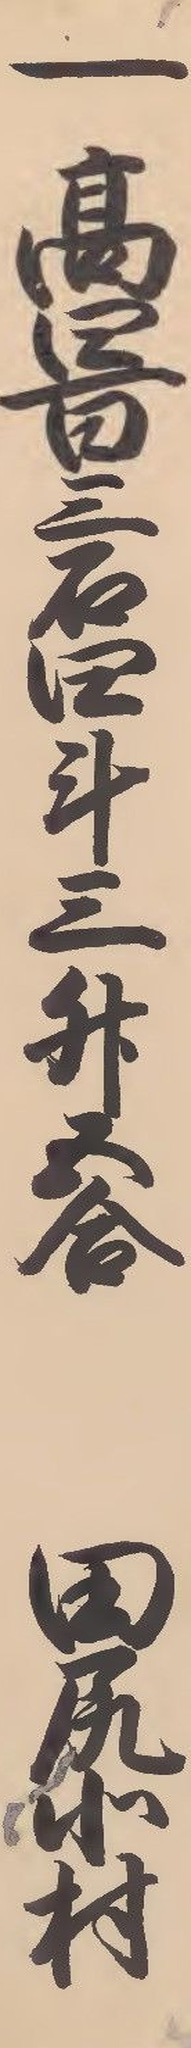一高四百三石四斗三升五合田尻北村
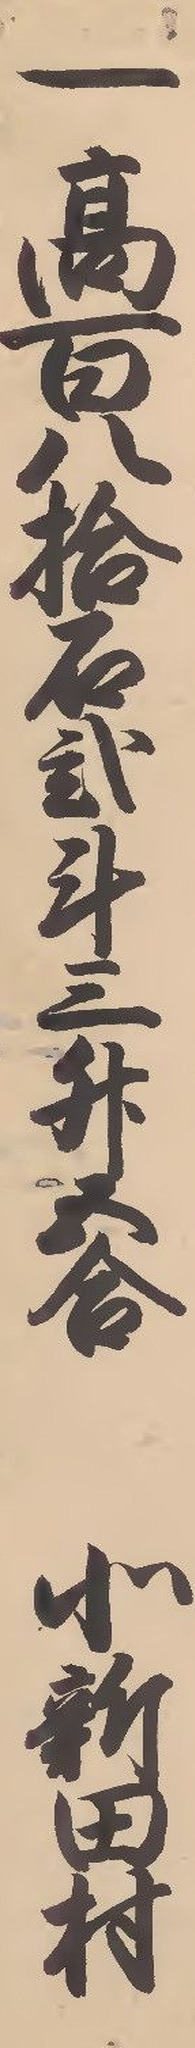一高百八拾石弐斗三升五合北新田村

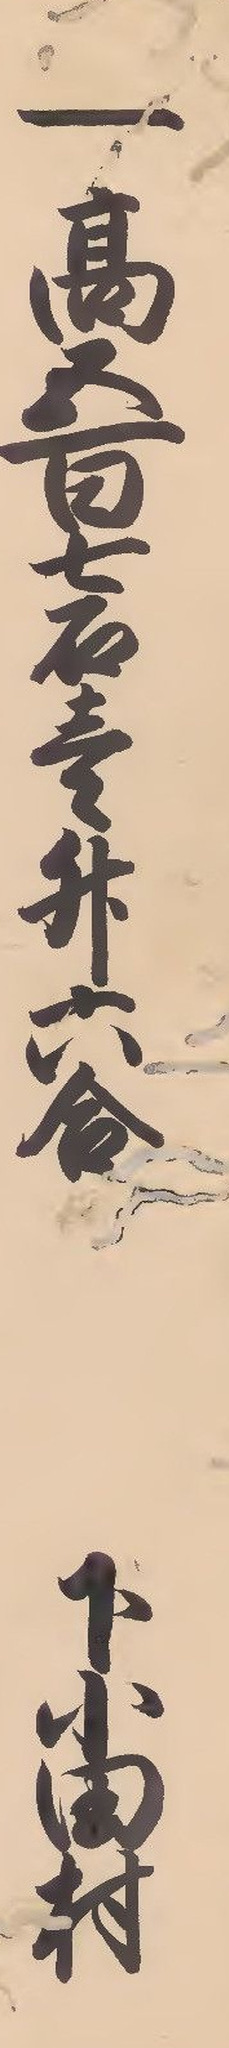一高五百七石壱升六合下小田村
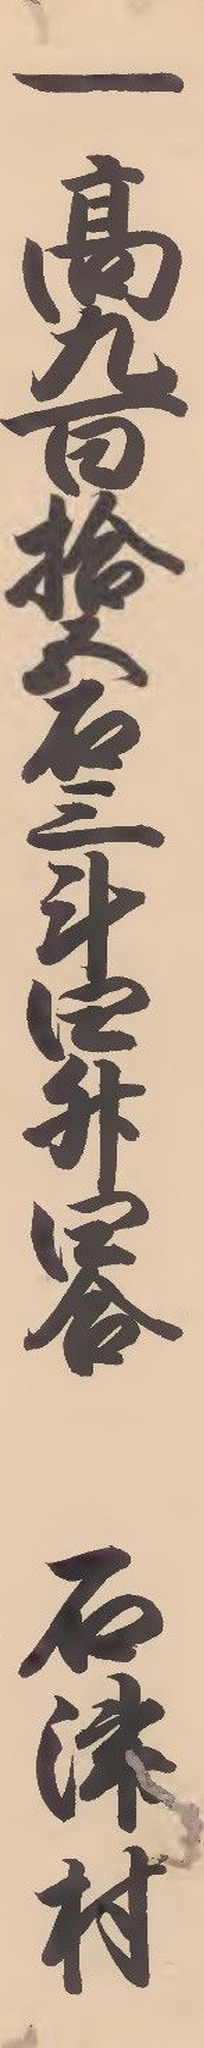一高九百拾五石三斗四升四合石津村
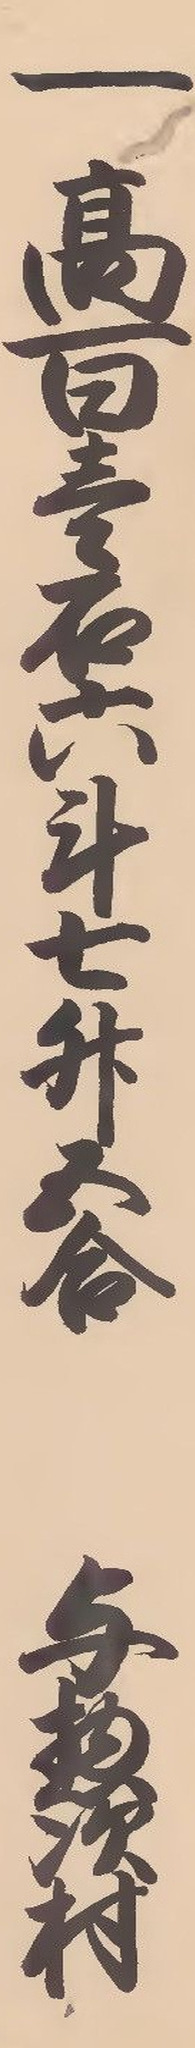一高百壱石六斗七升五合与惣次村
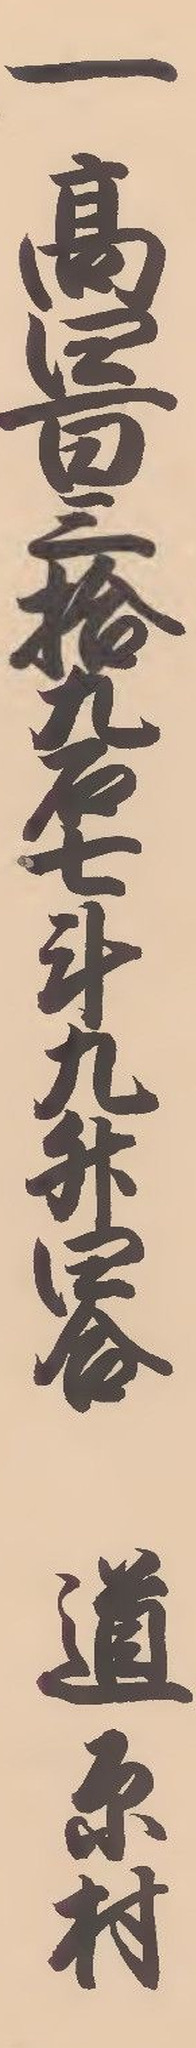一高四百三拾九石七斗九升四合道原村
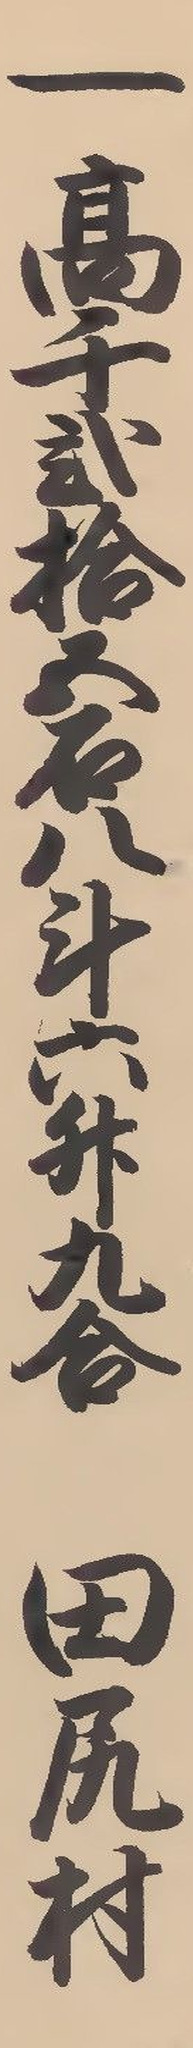一高千弐拾五石八斗六升九合田尻村
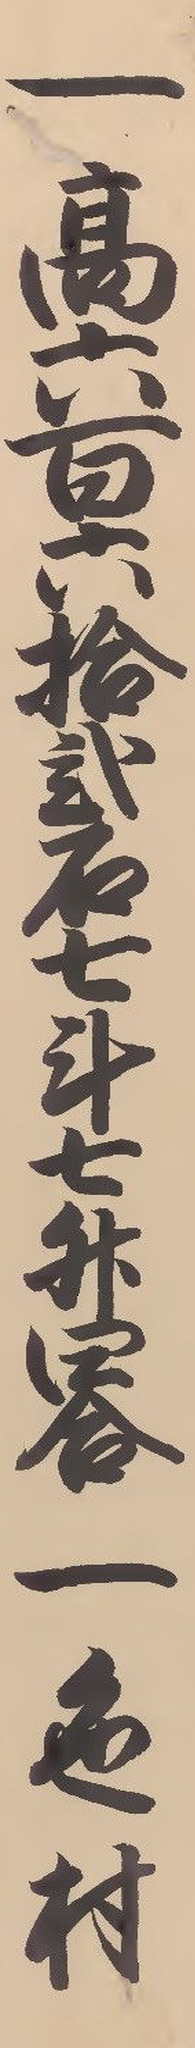一高六百六拾弐石七斗七升四合一色村
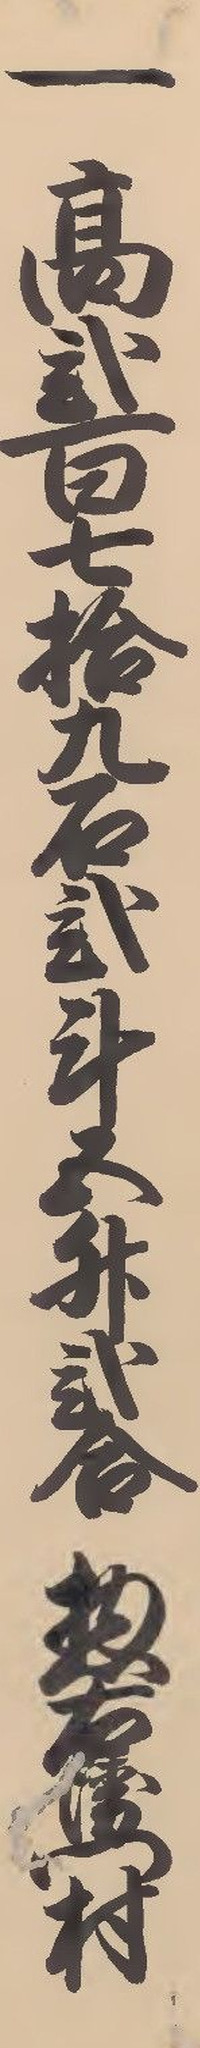一高弐百七拾九石弐斗五升弐合惣右衛門村
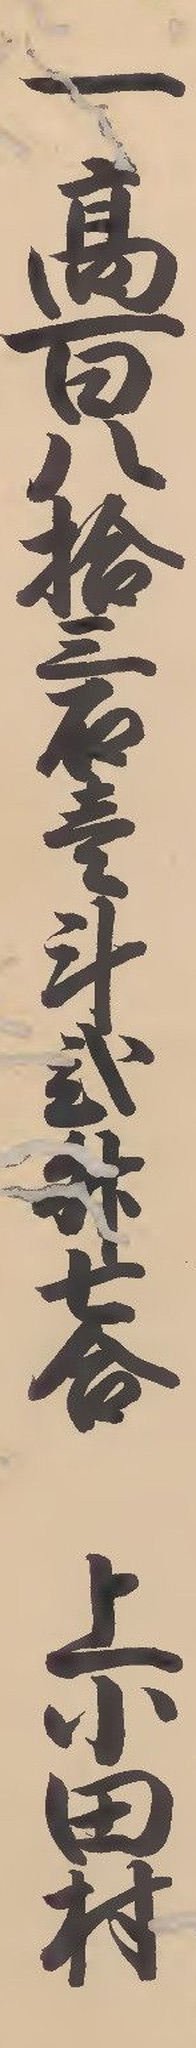一高百八拾三石壱斗弐升七合上小田村

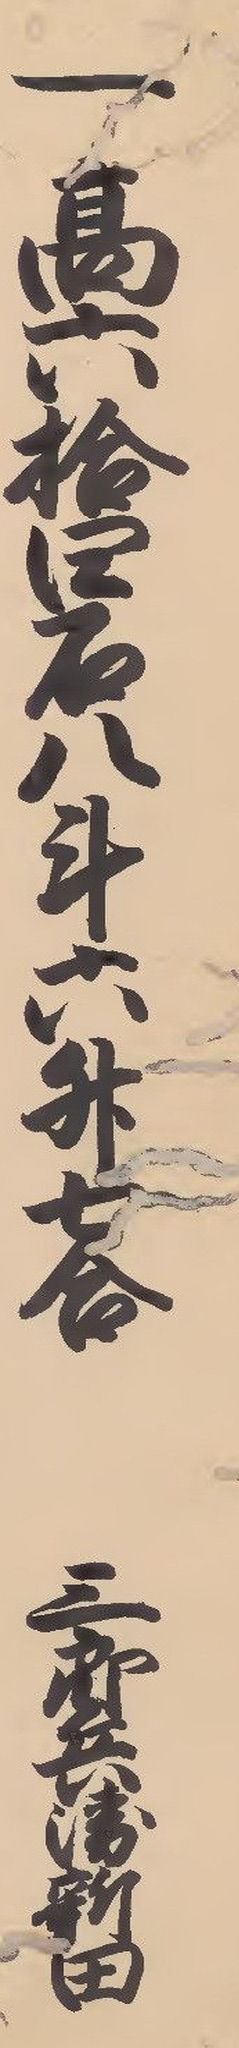一高六拾四石八斗六升七合三郎兵衛新田
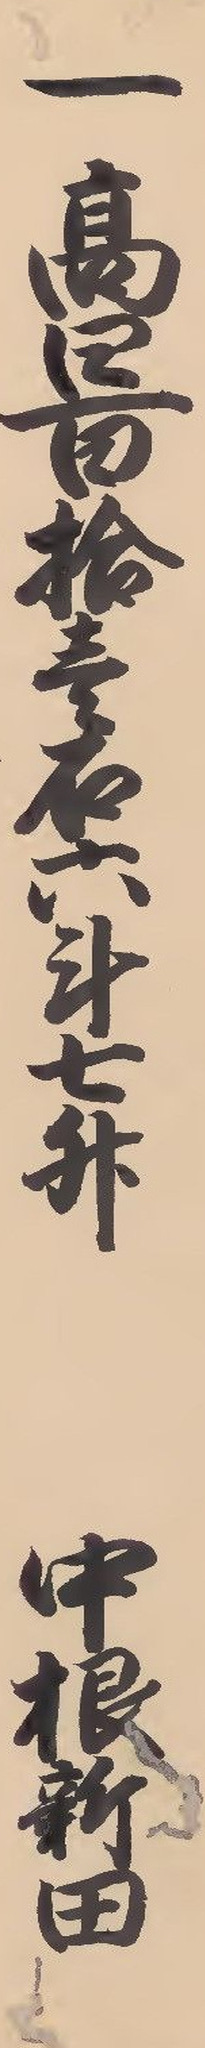一高四百拾壱石六斗七升中根新田
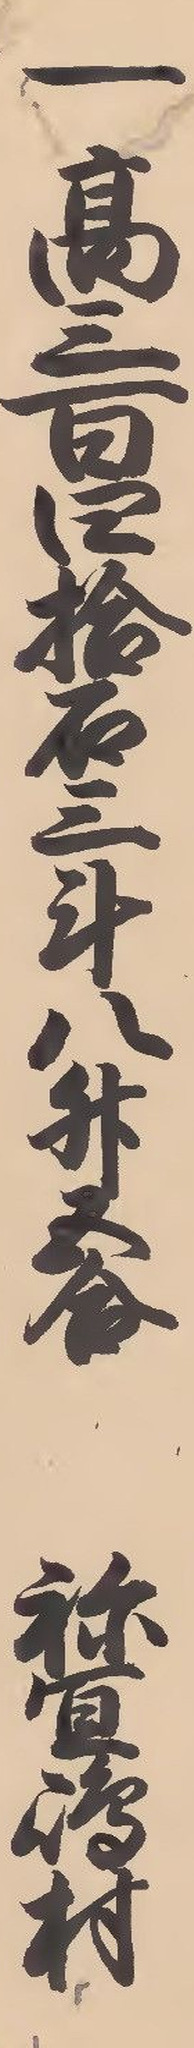一高三百四拾石三斗八升五合祢宜島村
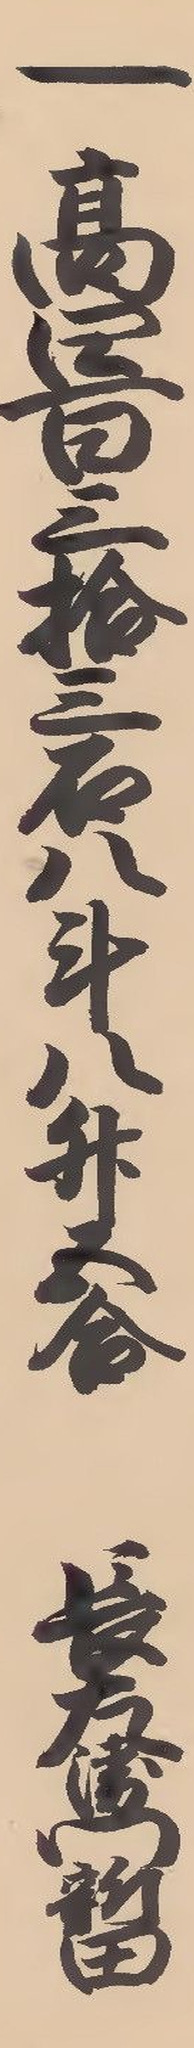一高四百三拾三石八斗八升五合長左衛門新田
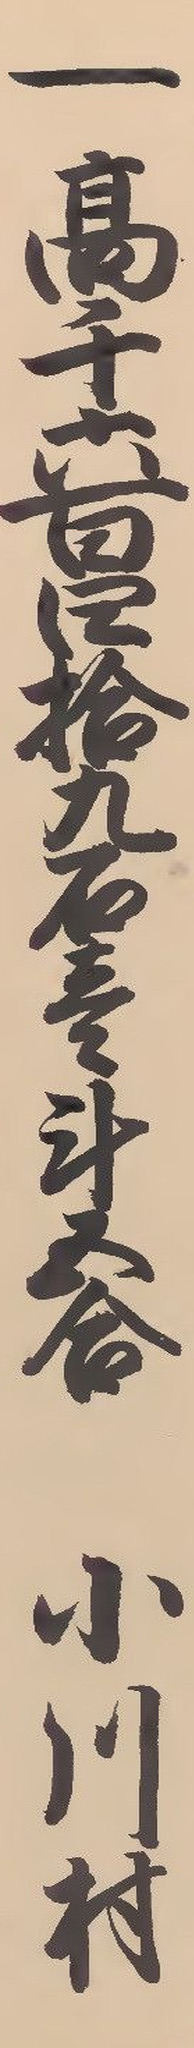一高千六百四拾九石壱斗五合小川村
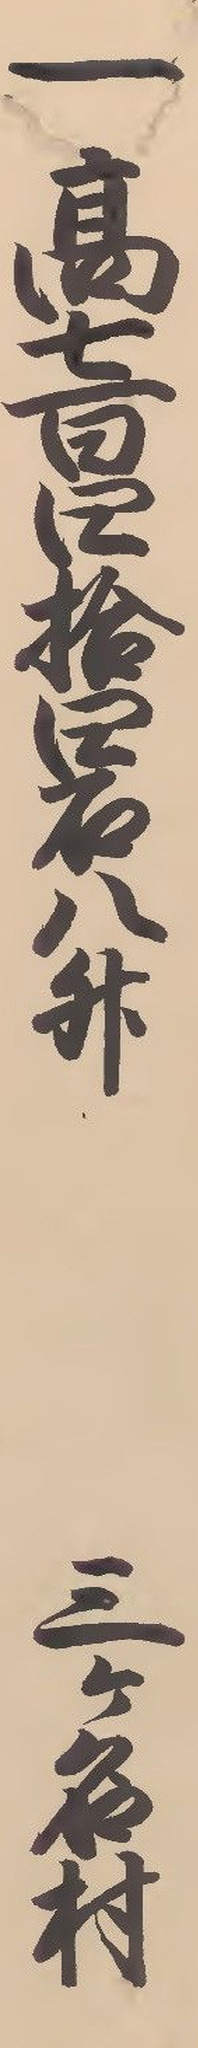一高七百四拾四石八升三ヶ名村
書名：駿河国郷帳
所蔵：国立公文書館 National Archives of Japan
